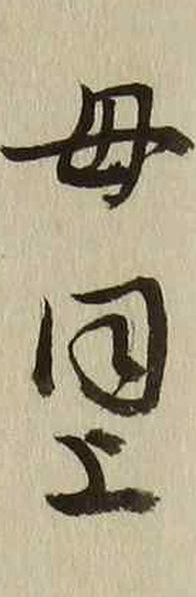母同上
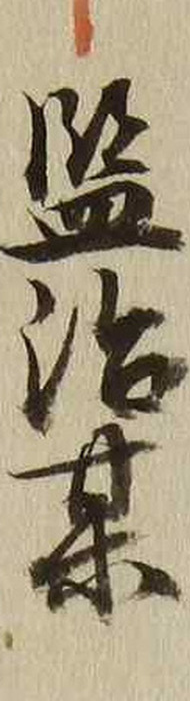監治某
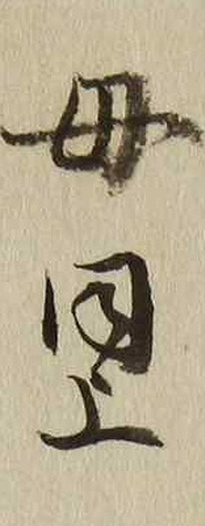母同上
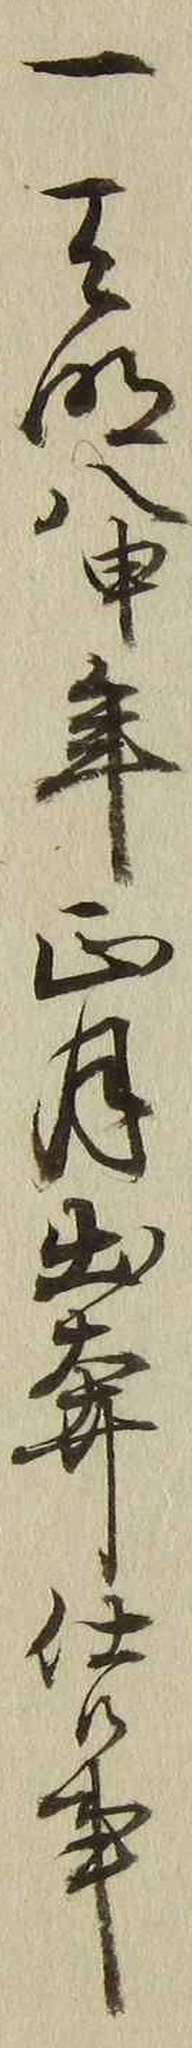一天明八申年正月出奔仕候事

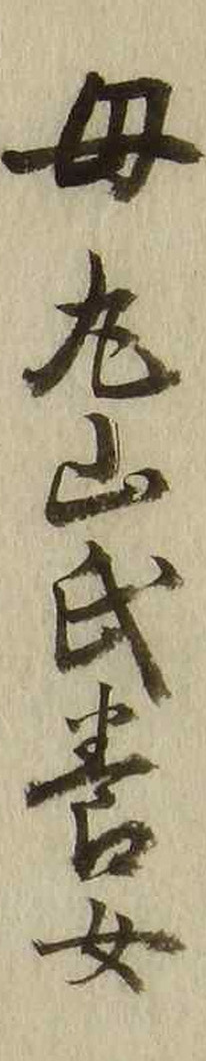母丸山氏養女
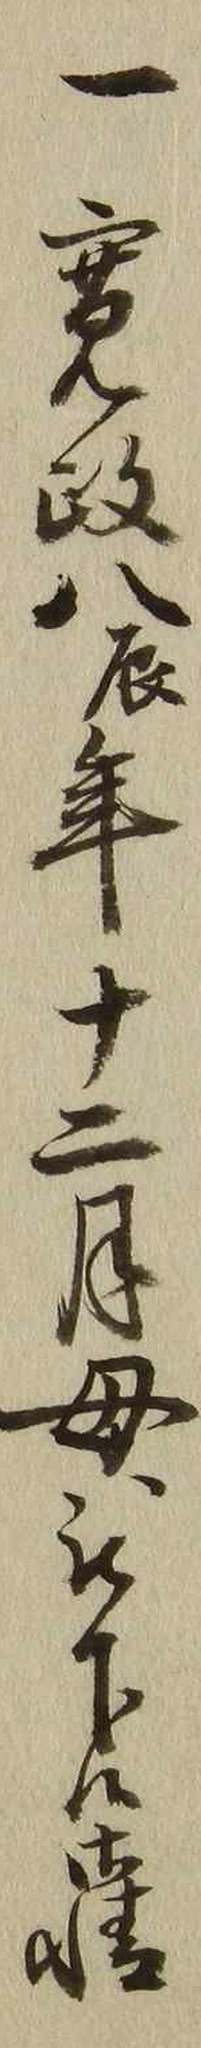一寛政八辰年十二月母被下候御情
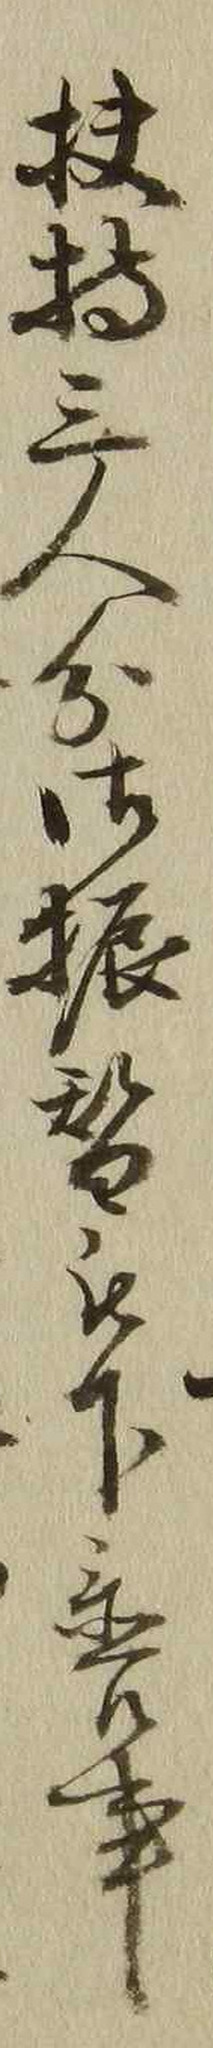扶持三人分御振替被下置候事
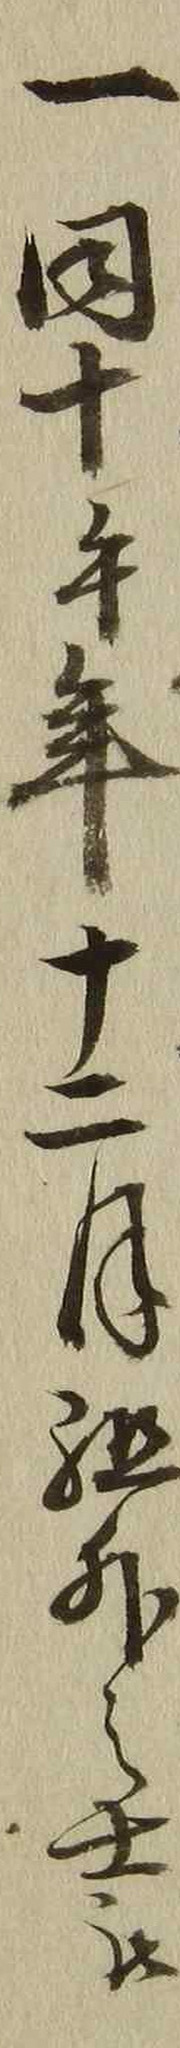一同十午年十二月組外之士被
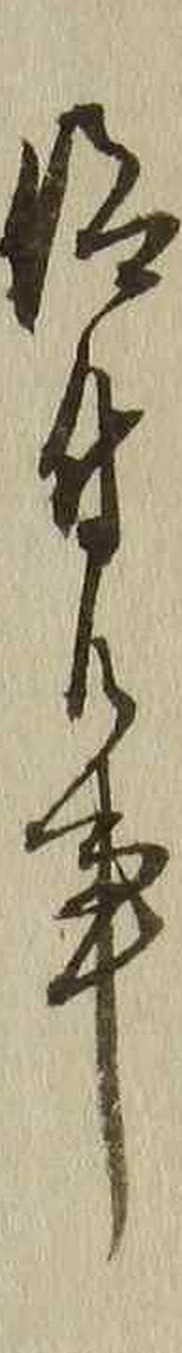仰付候事
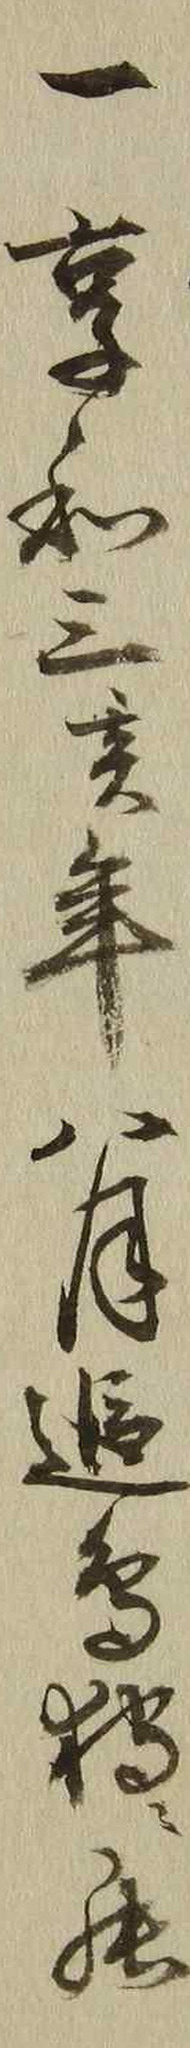一享和三亥年八月追鳥狩ニ罷
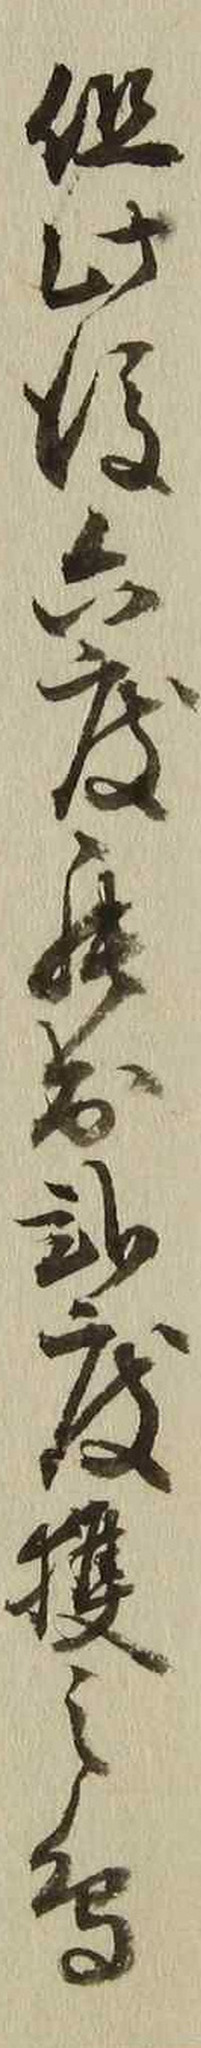但此後六度罷出弐度獲之鳥
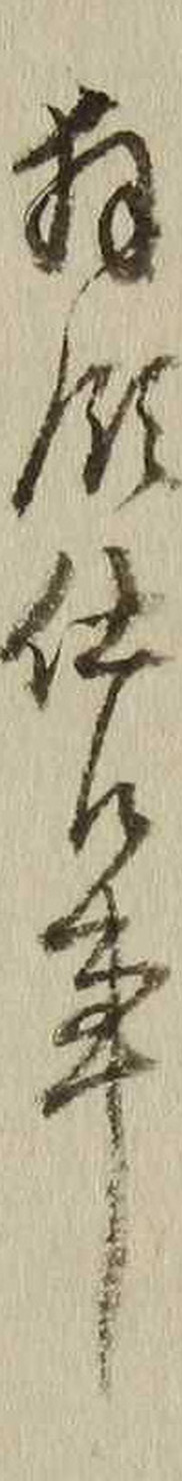拝領仕候事
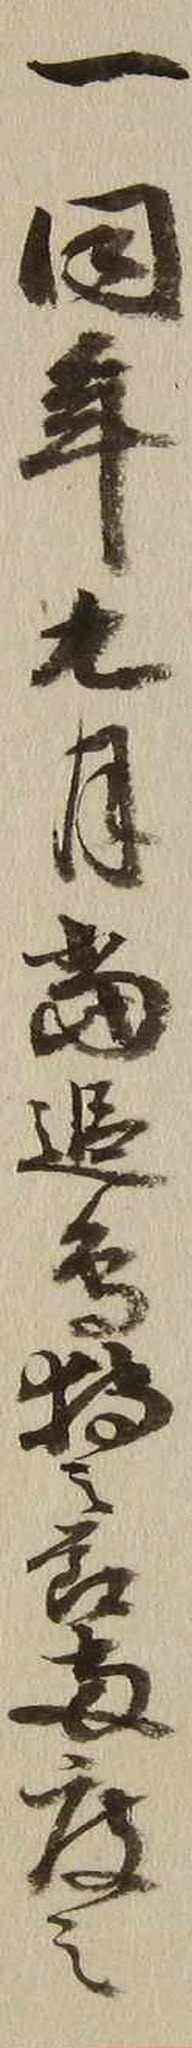一同年九月当追鳥狩之節両度之
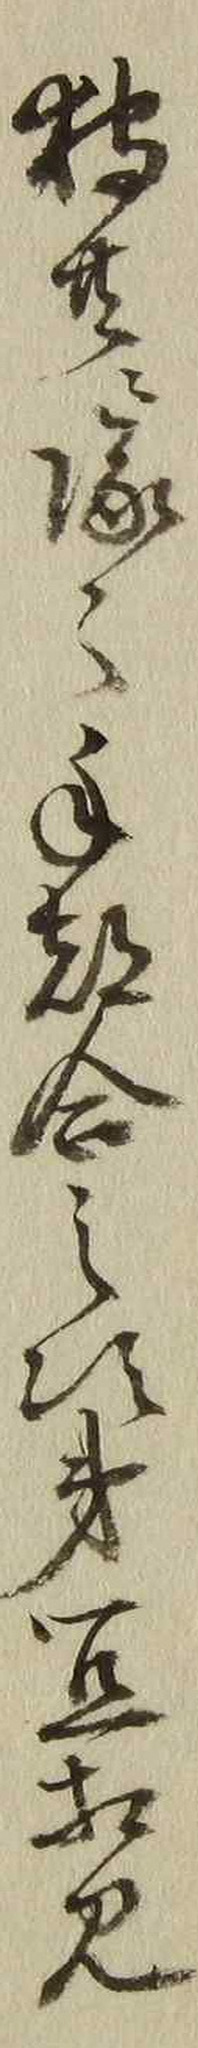狩共ニ隧之手都合之次第宜相見
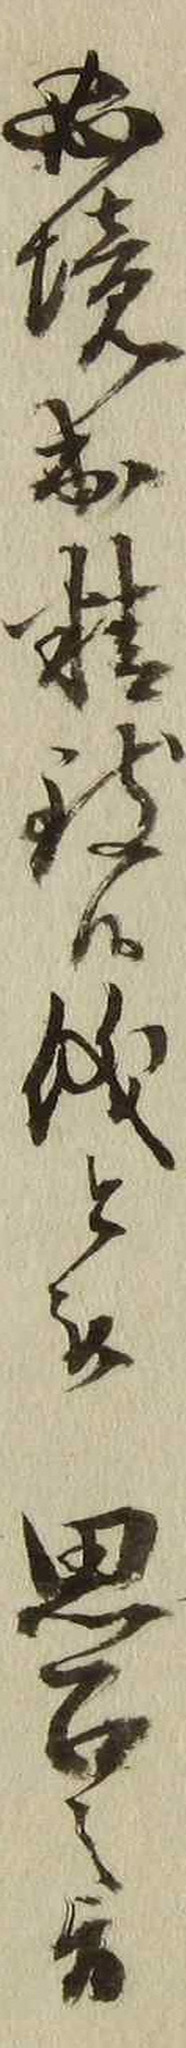出境出精致正味候儀と被思召之旨
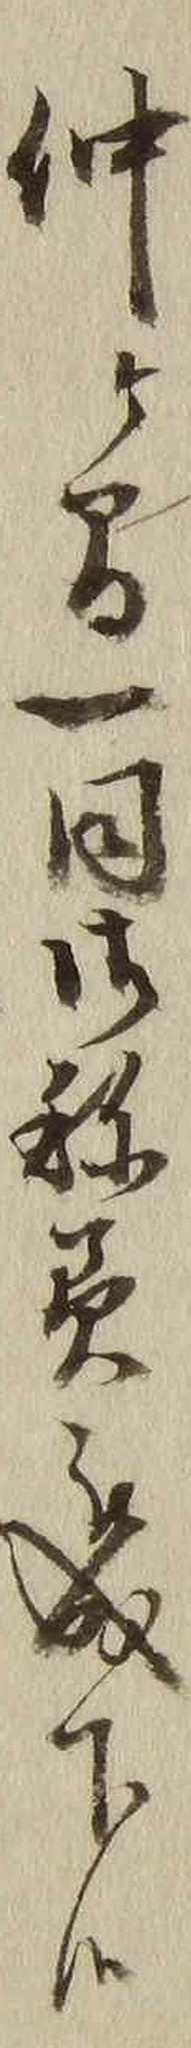仲ケ間一同御称美被成下候
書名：諸士系譜　巻之64　と之部7
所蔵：会津若松市立会津図書館
